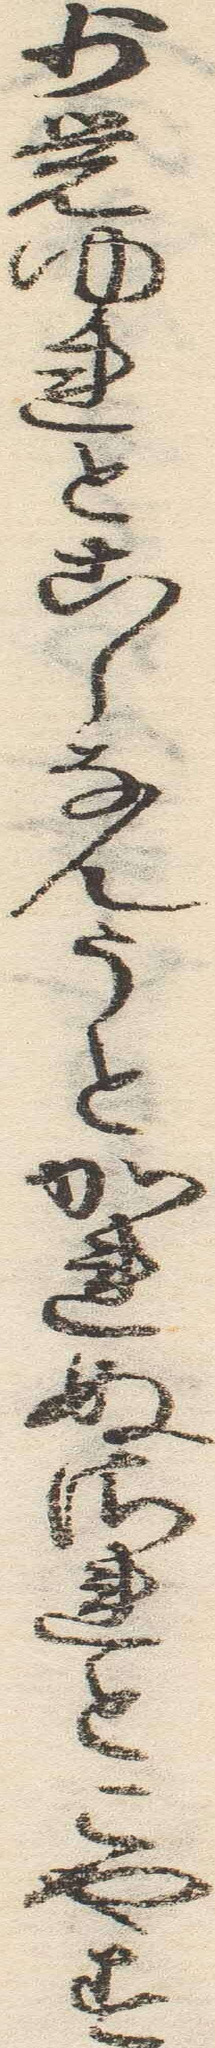少覚ゆれとこしなんうとかれぬされとこやす
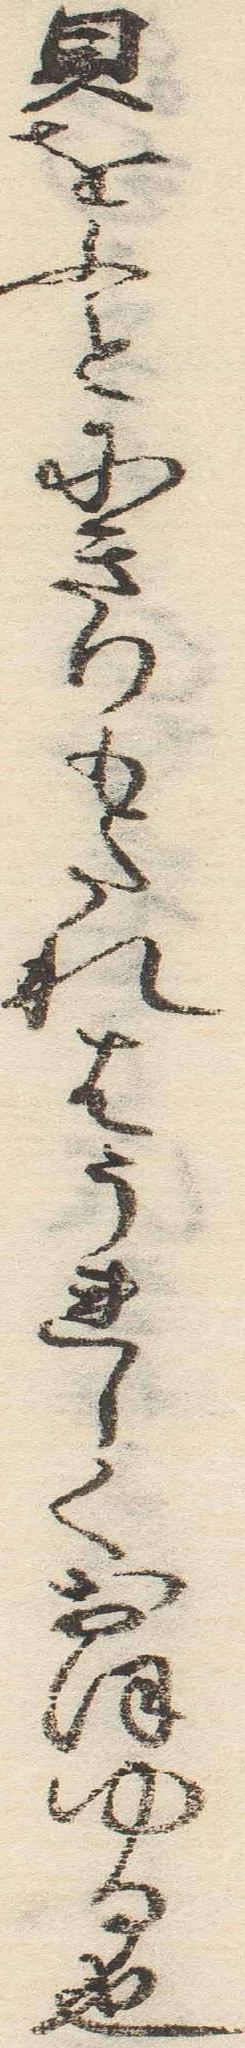貝をふとにきりもたれはうれしくおほゆる也
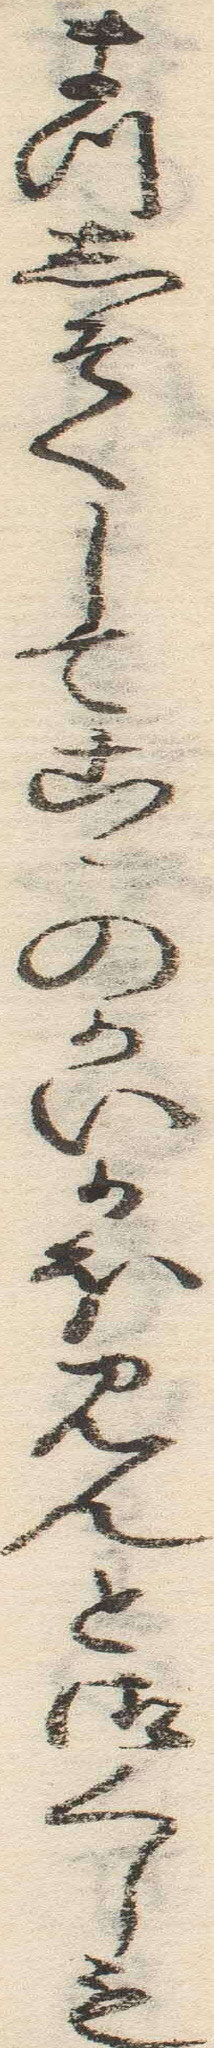まつしそくしてこゝのかいかほ見んと御くしも
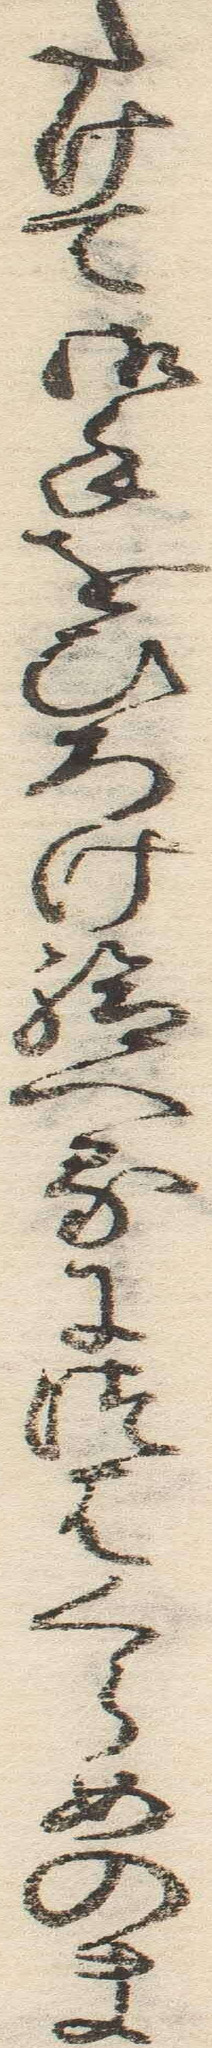たけて御手をひろけ給へるにつはくらめのま
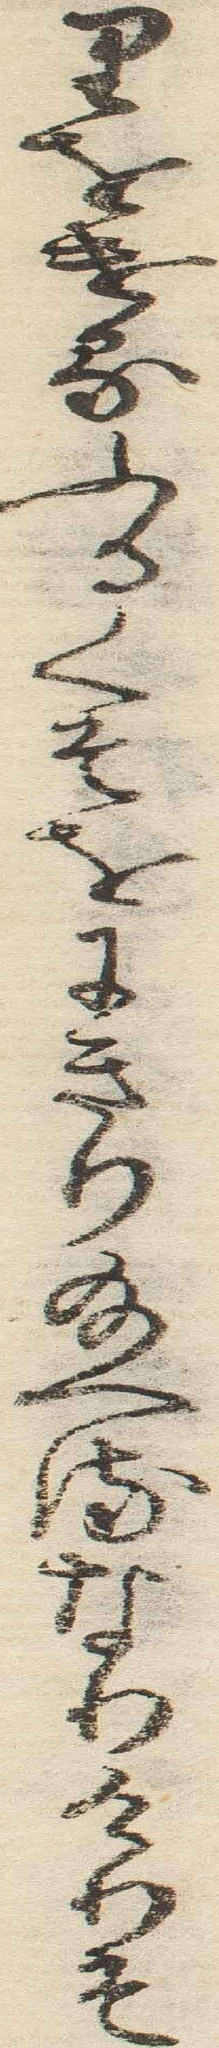りをけるふるくそをにきり給へるなりけりそ
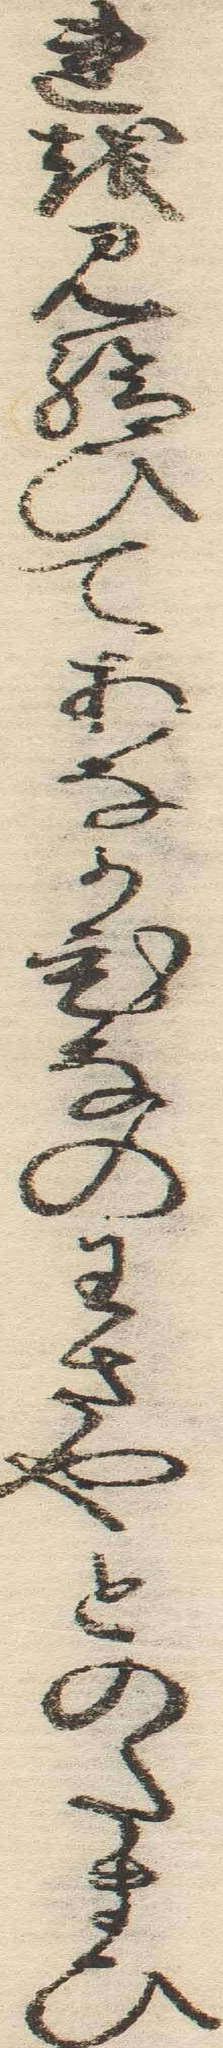れを見給ひてあなかひなのわさやとのたまひ
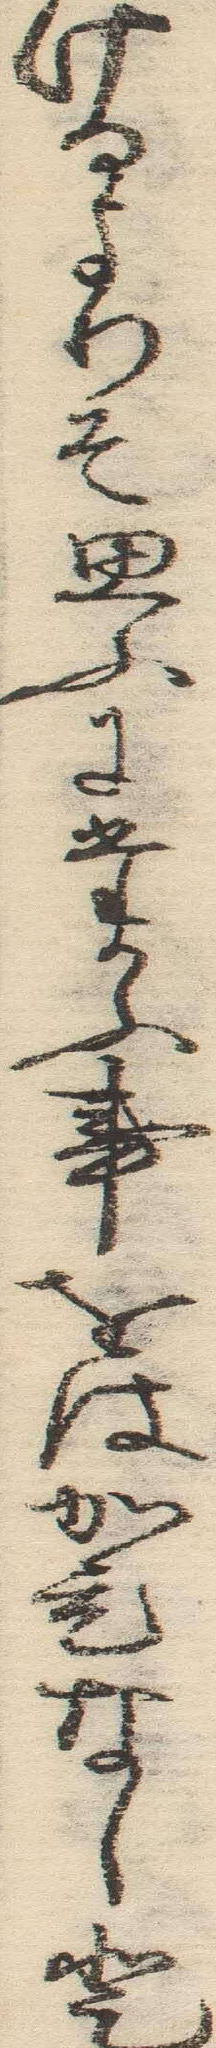けるよりそ思ふにたかふ事をはかひなしと

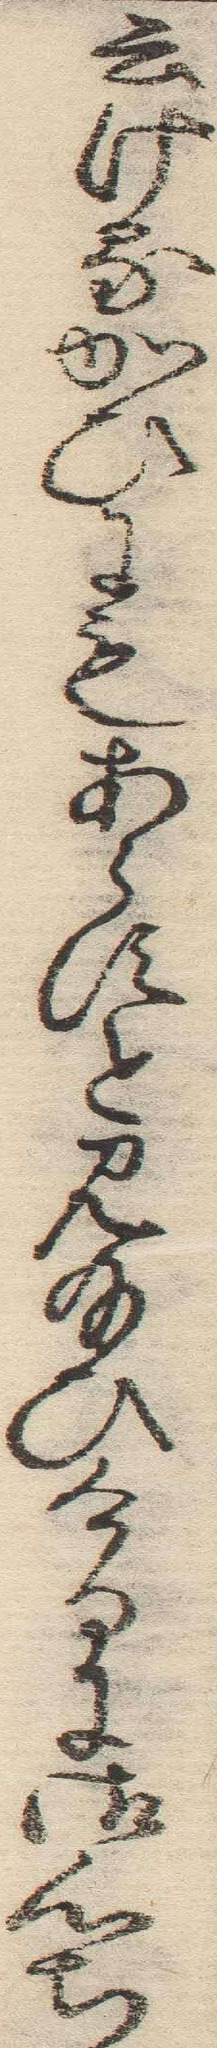云けるかひにもあらすと見給ひけるに御心ち
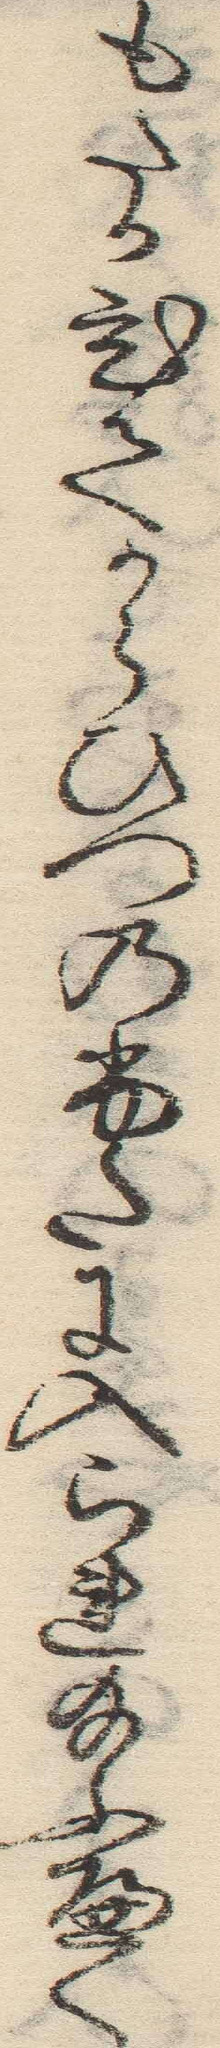もたかひてからひつのふたに入られ給ふへく
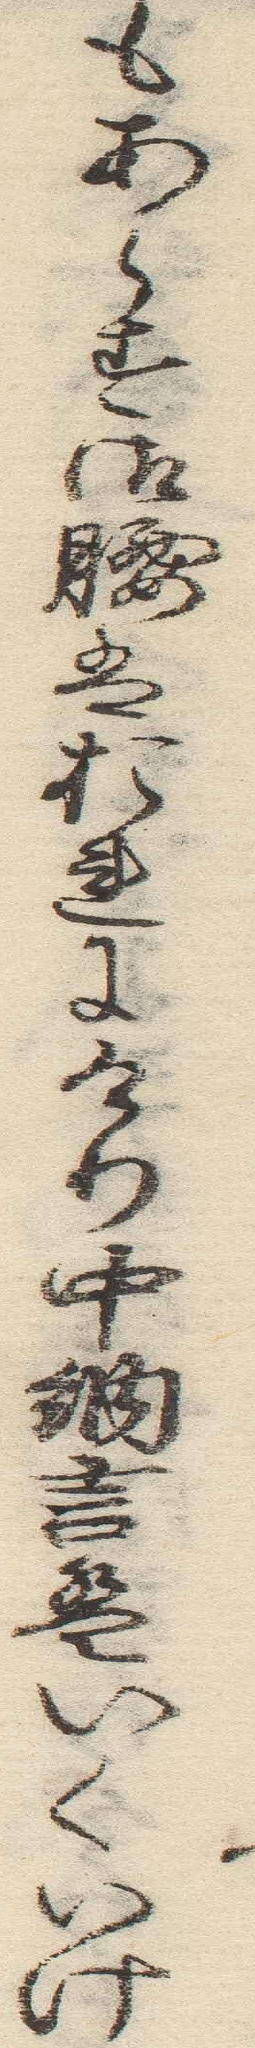もあらす御腰はおれにけり中納言はいくいけ
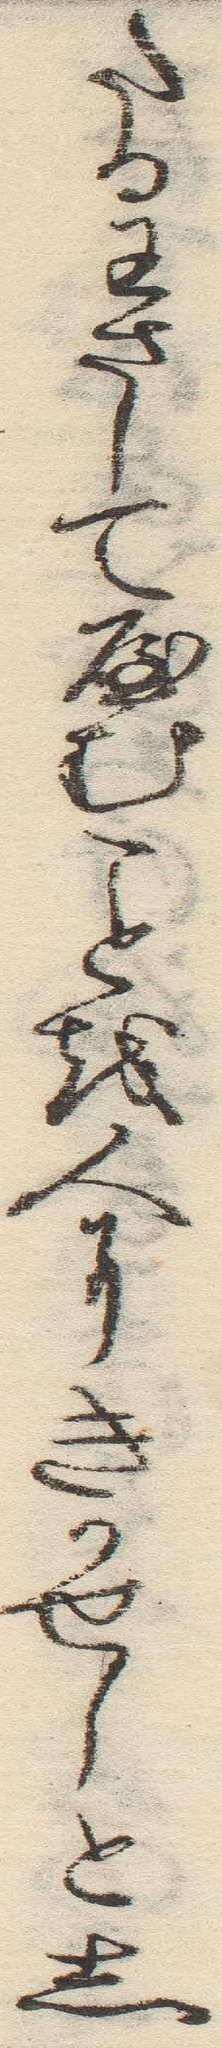たるわさしてやむことを人にきかせしとし
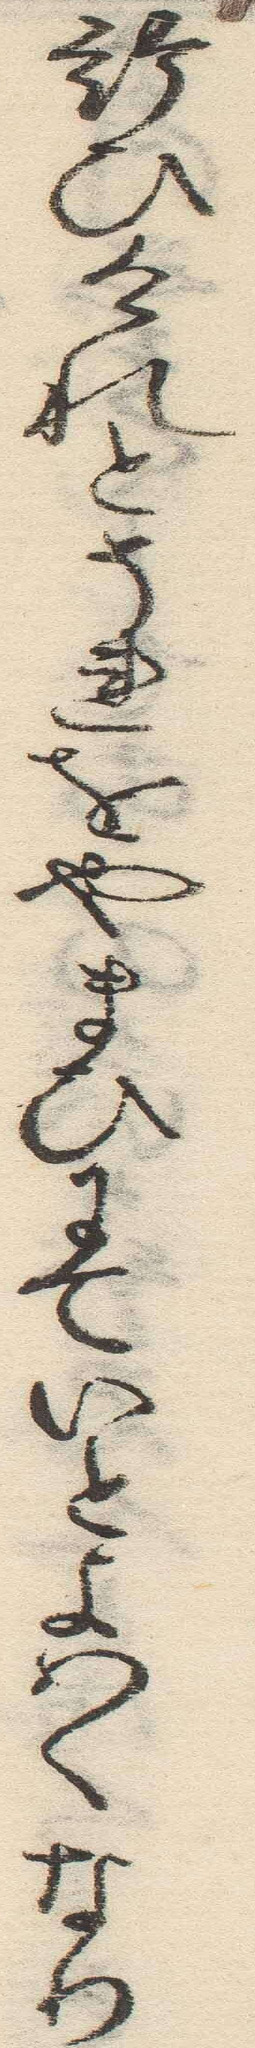給ひけれとそれをやまひにていとよはくなり
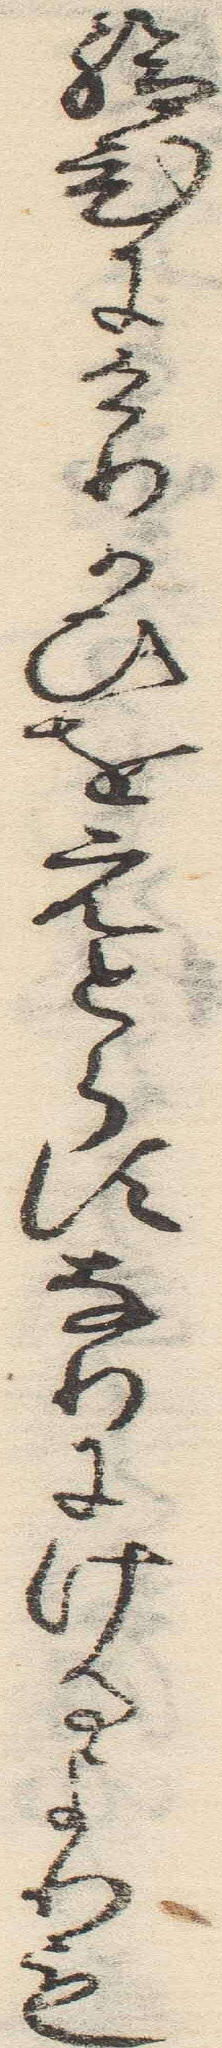給ひにけりかひをえとらすなりにけるよりも
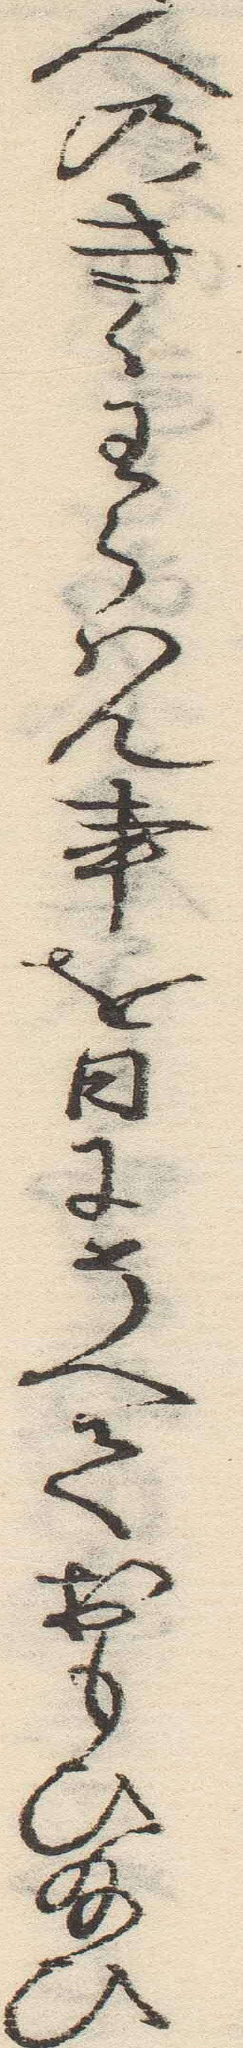人のきゝわらはん事を日にそへておもひ給ひ
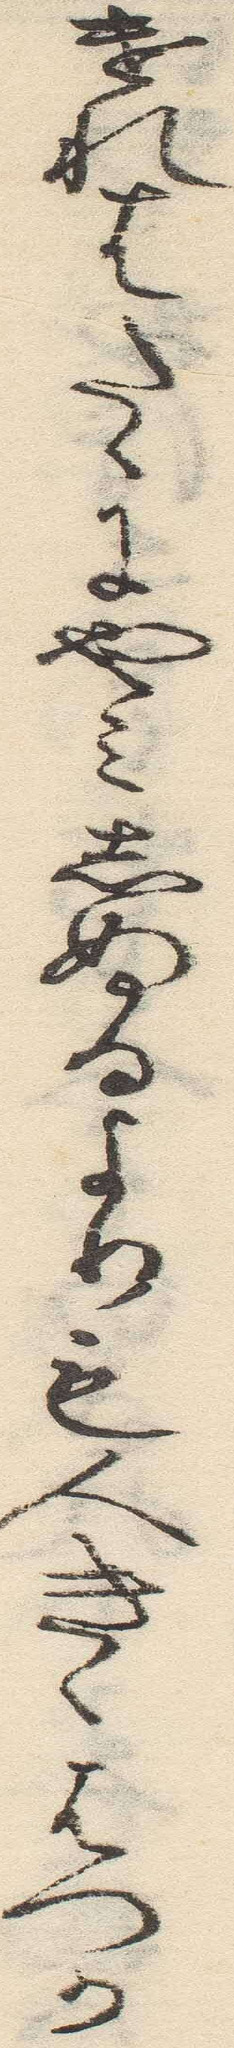けれはたゝにやみしぬるよりも人きゝはつか
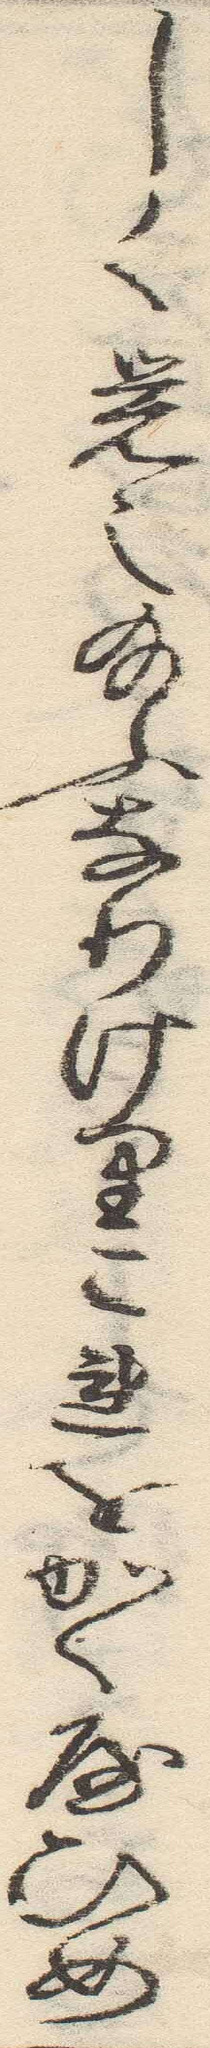しく覚え給ふなりけりこれをかくやひめ
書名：竹取物語
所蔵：東京学芸大学附属図書館 国文学研究資料館
